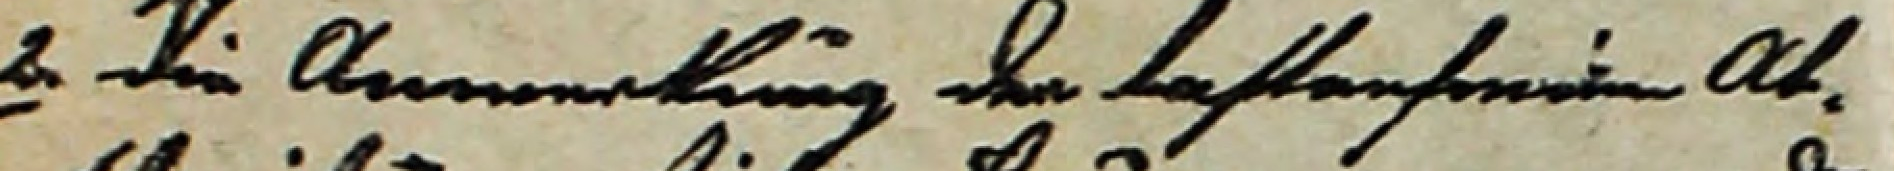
2. Die Anmerkung der lastenfreien Ab=
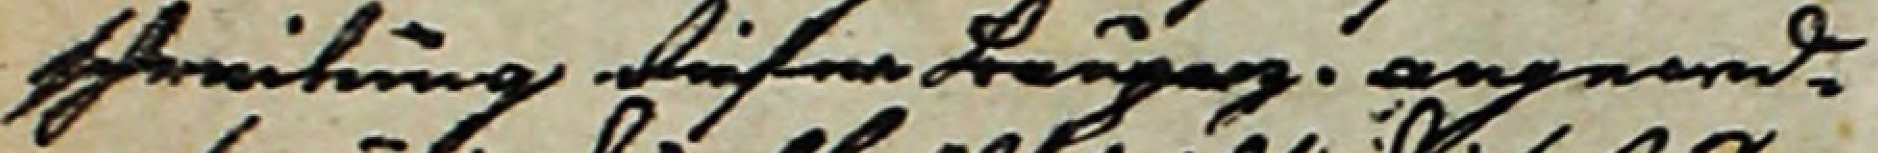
schreibung diesen Bauparz. angeord=
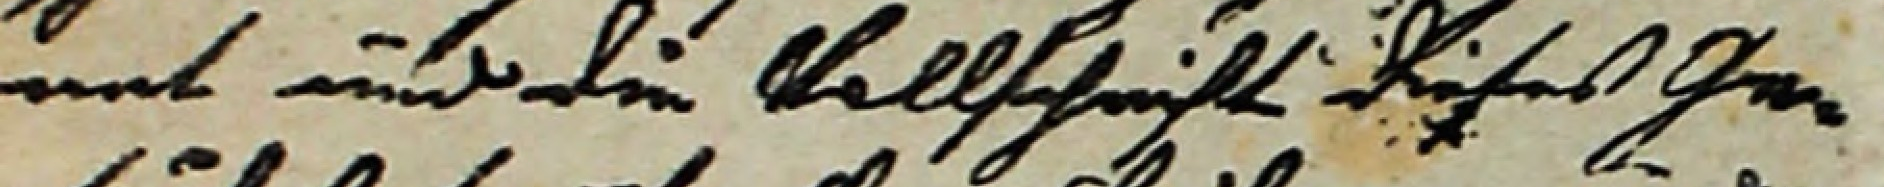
net und die Vollschrift dieses Ge=
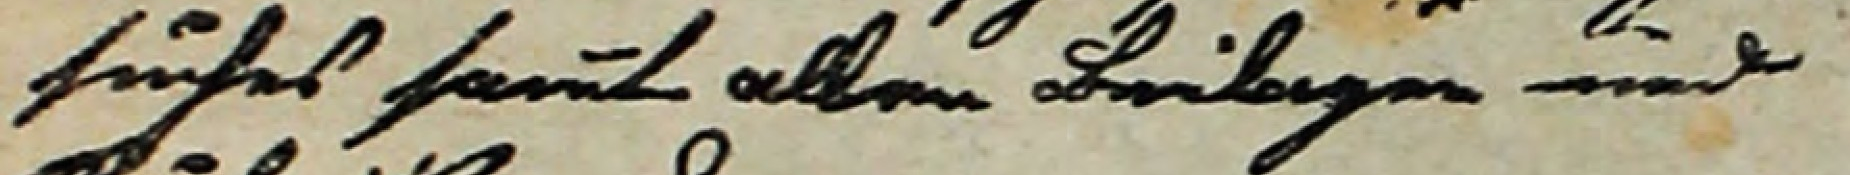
suches sammt allen Beilagen und
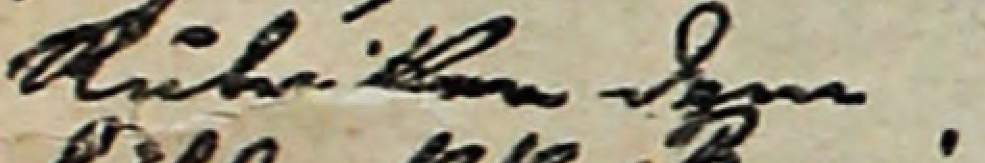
Rubriken dem
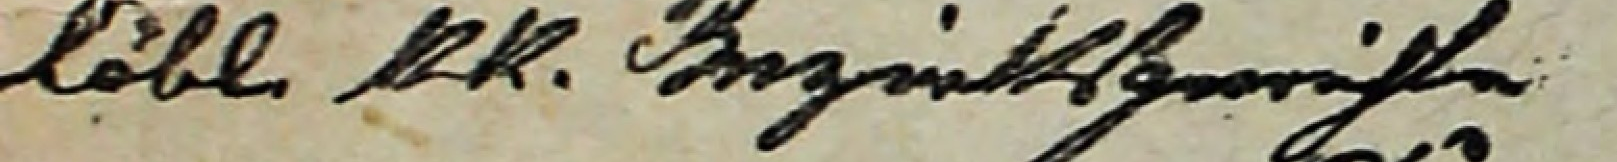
löbl. kk. Bezirksgerichte
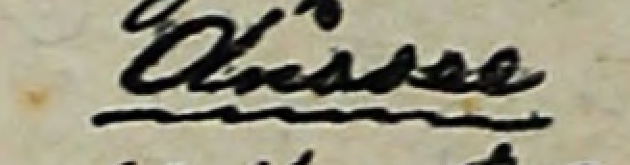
Aussee
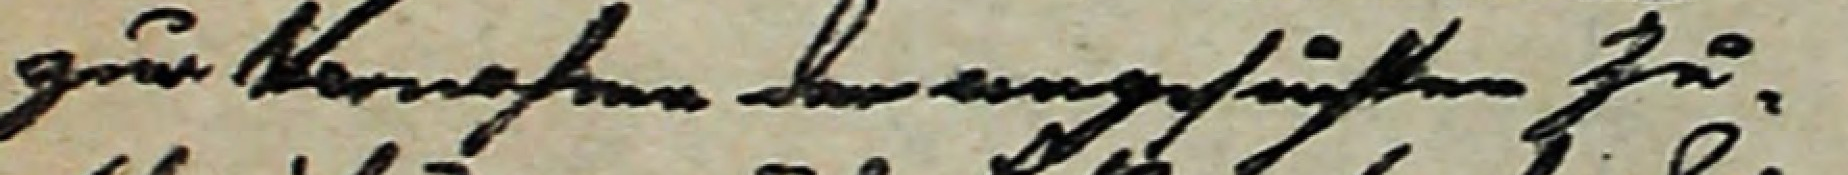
zur Vornahme den angesuchten Zu„
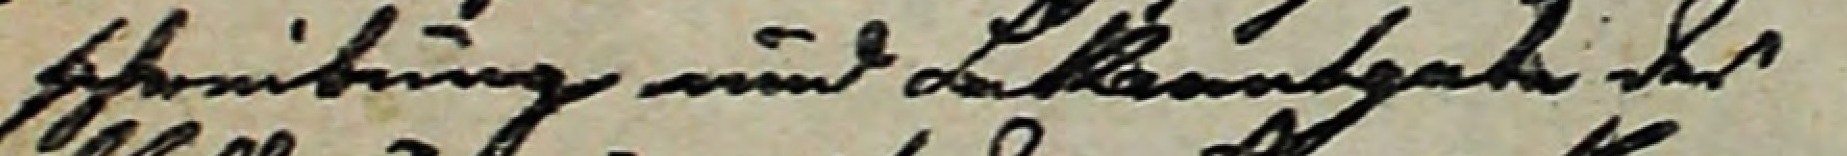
schreibung und Bekanntgabe des
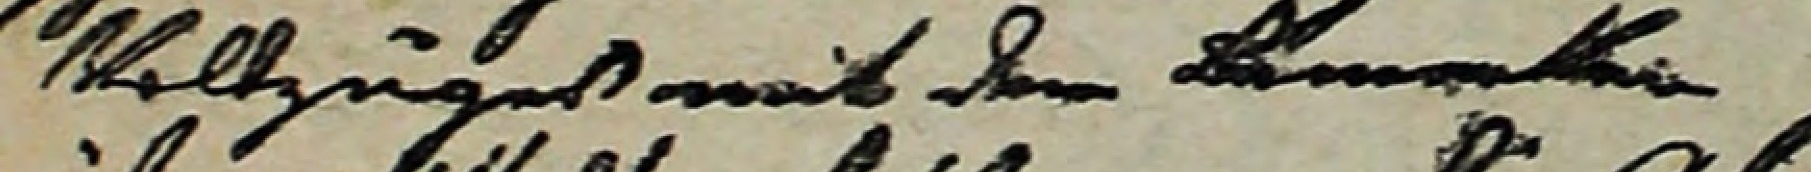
Vollzuges mit dem Benennken
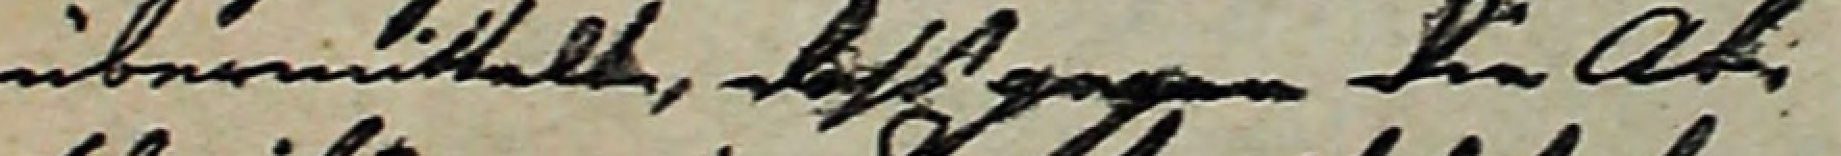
übermittelt, dass gegen die Ab„
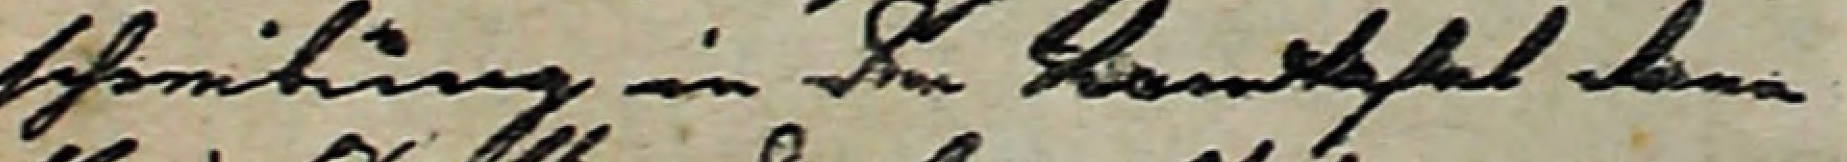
schreibung in der Landtafel dann
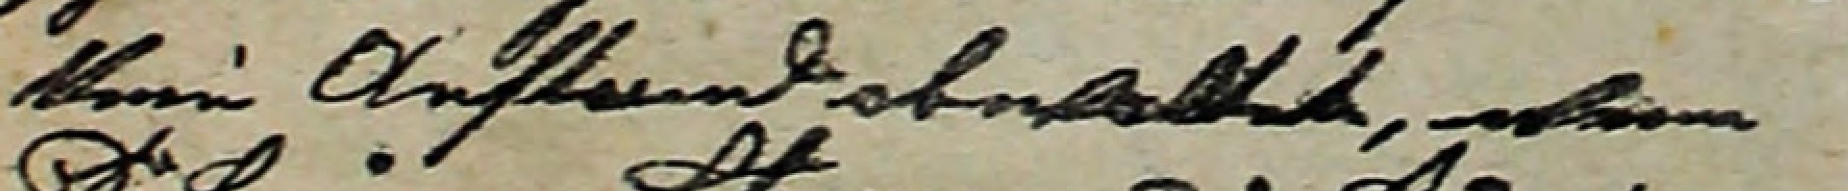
kein Anstand obwaltet, denen
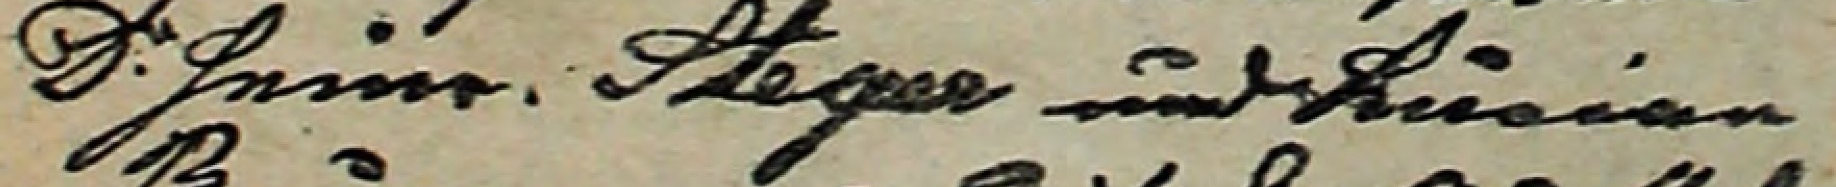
Dr. Heinr. Steger und Lucian
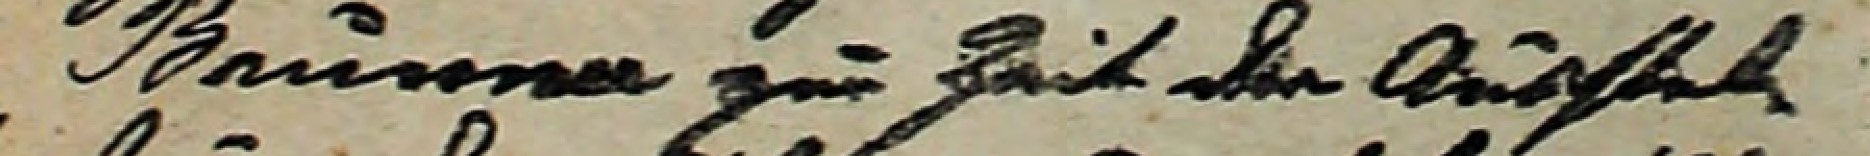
Brunner zur Zeit der Ausstel„
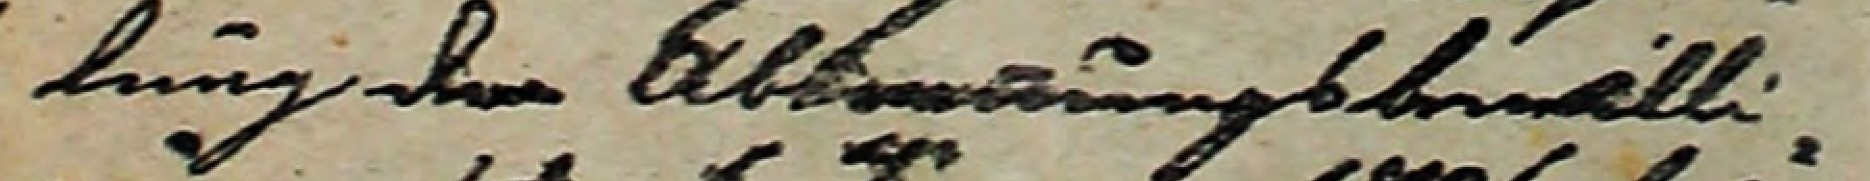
lung dem Abtrennungsbewilli=
